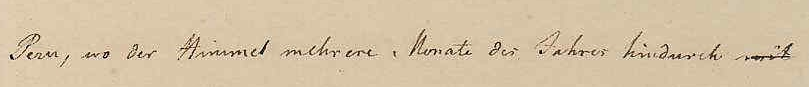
Peru, wo der Himmel mehrere Monate des Jahres hindurch mit
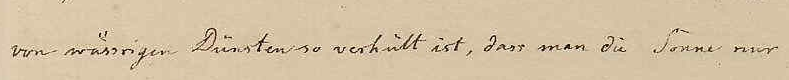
von wässrigen Dünsten so verhüllt ist, dass man die Sonne nur
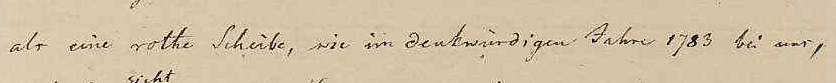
als eine rothe Scheibe, wie im denkwürdigen Jahre 1783 bei uns,
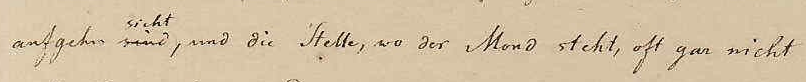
aufgehn sindsieht, und die Stelle, wo der Mond steht, oft gar nicht
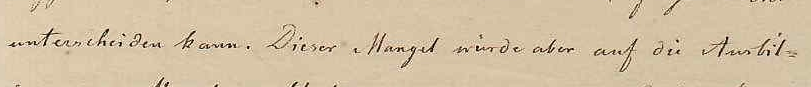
unterscheiden kann. Dieser Mangel würde aber auf die Ausbil-
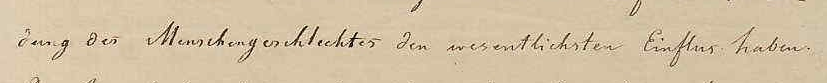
dung des Menschengeschlechtes den wesentlichsten Einflus haben.
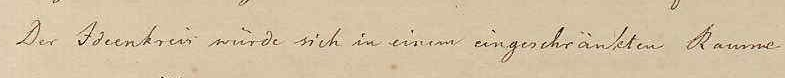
Der Ideenkreis würde sich in einem eingeschränkten Raume
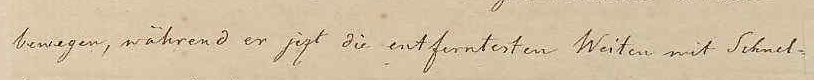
bewegen, während er jezt die entferntesten Weiten mit Schnel-
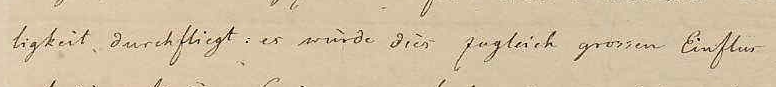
ligkeit durchfliegt: es würde dies zugleich grossen Einflus
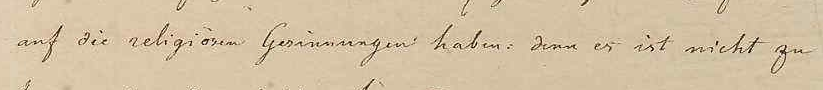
auf die religiösen Gesinnungen haben: denn es ist nicht zu
